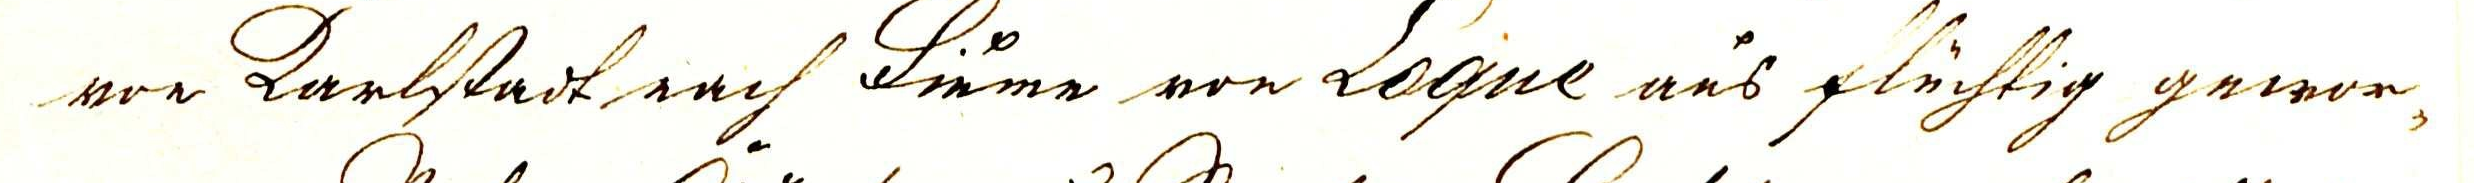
von Karlstadt nach Fiume von Loque aus flüchtig gewor¬
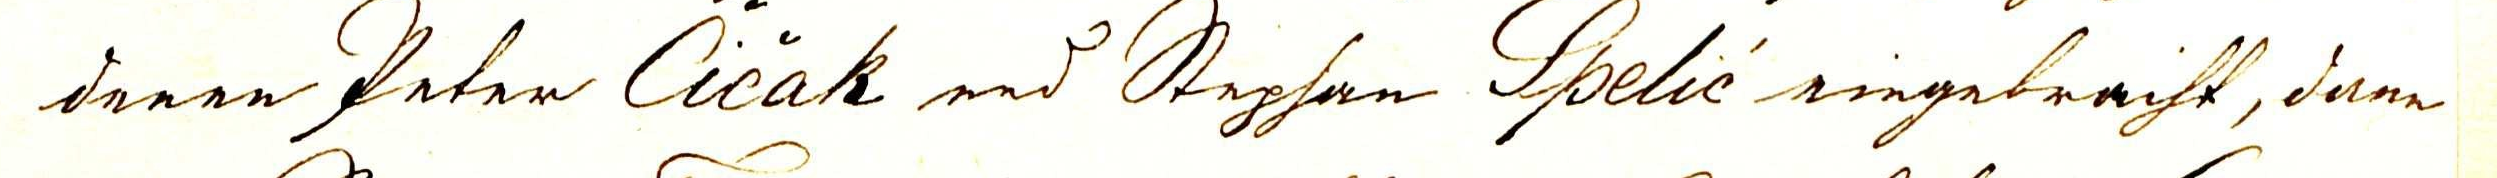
denen Peter Čičak und Stephan Spelić eingebracht, dann
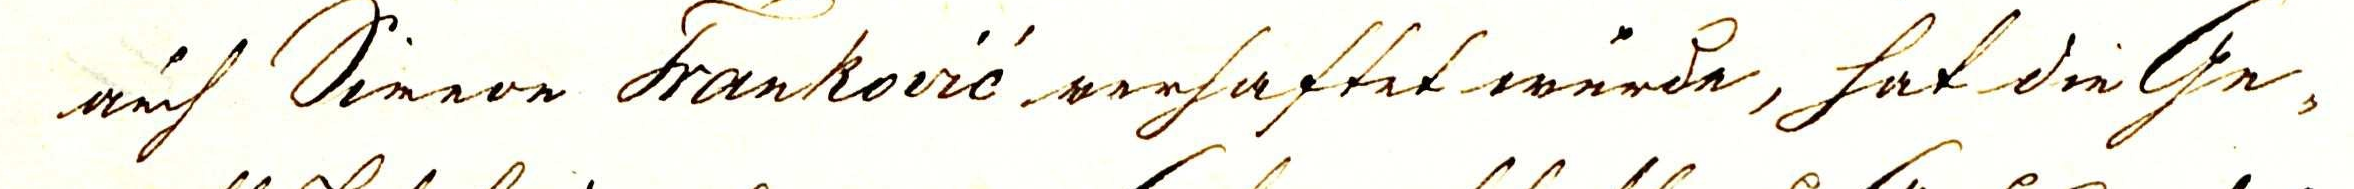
auch Simeon Franković verhaftet wurde, hat die Ge¬
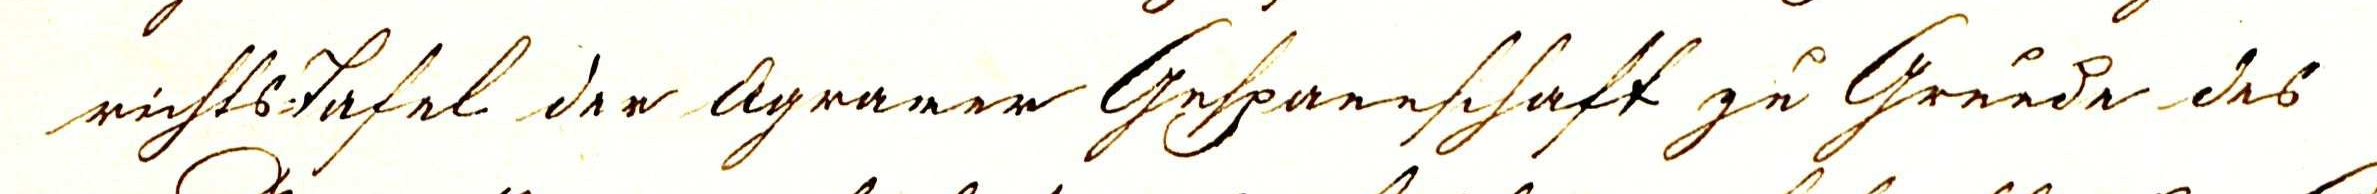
richts-Tafel der Agramer Gespannschaft zu Grunde des
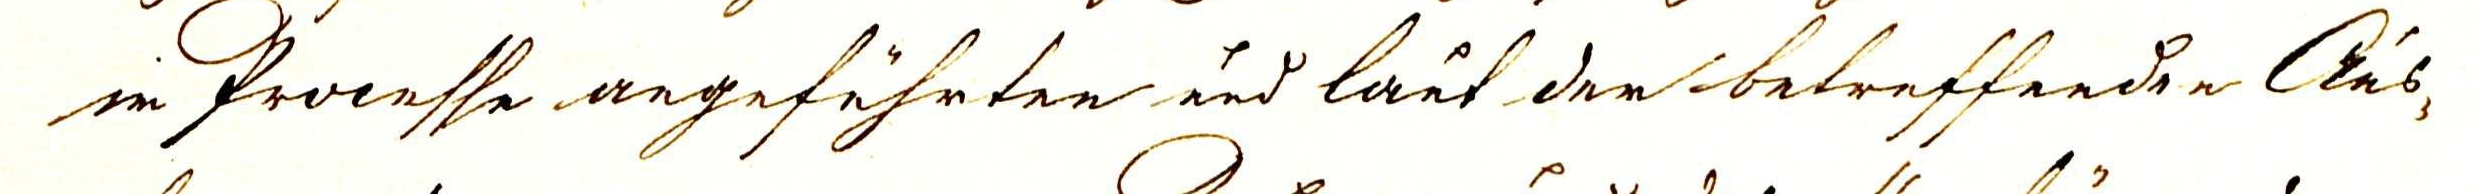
im Processe angeführten und laut der betreffende Aus¬
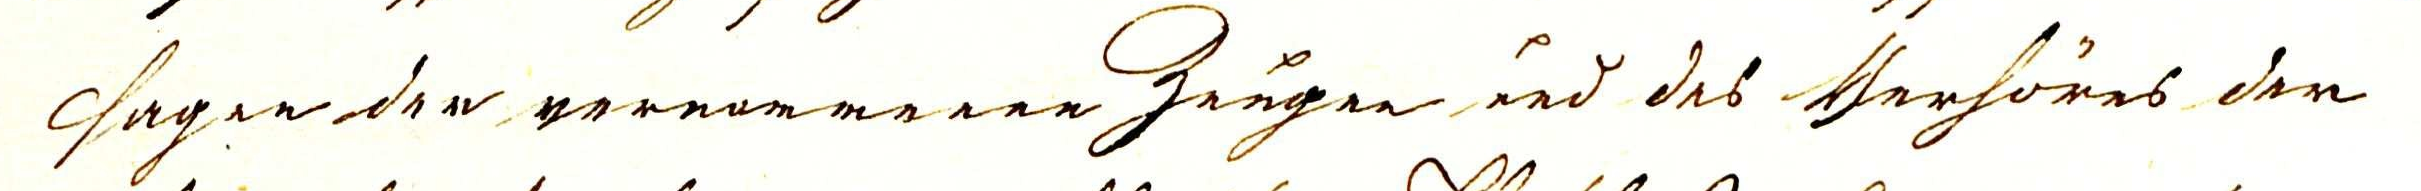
sagen der vernommenen Zeugen und das Verhöres der
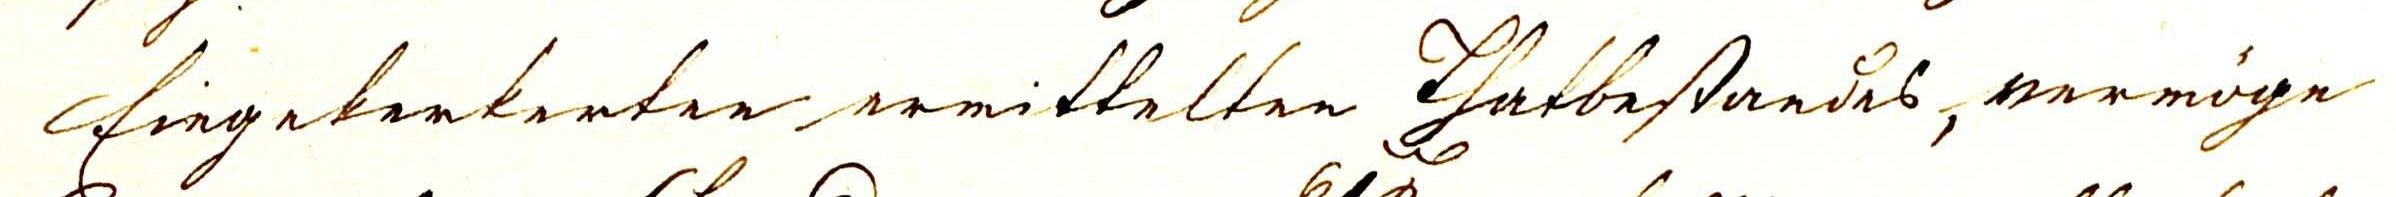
Eingekerkerten ermittelten Thatbestandes, vermöge
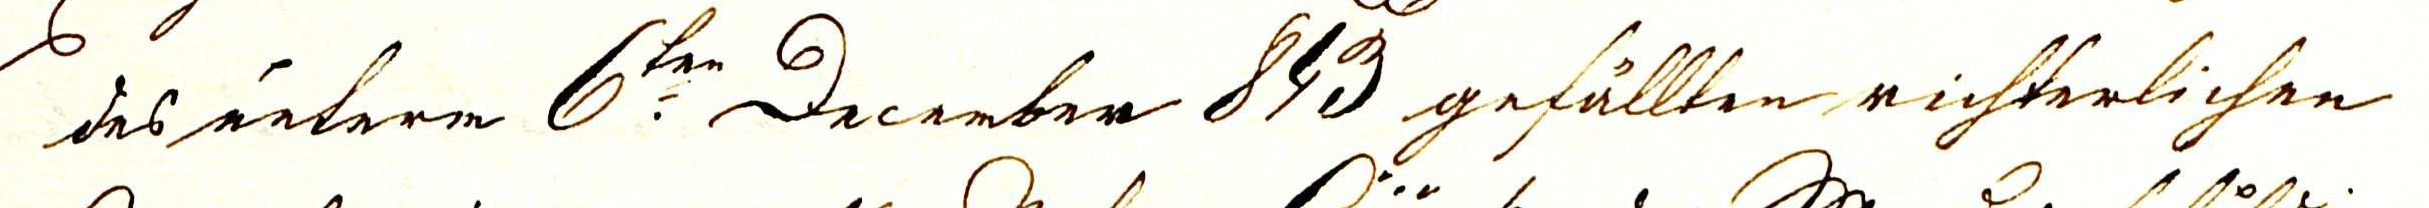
des unterm 6ten December 843 gefällten richterlichen
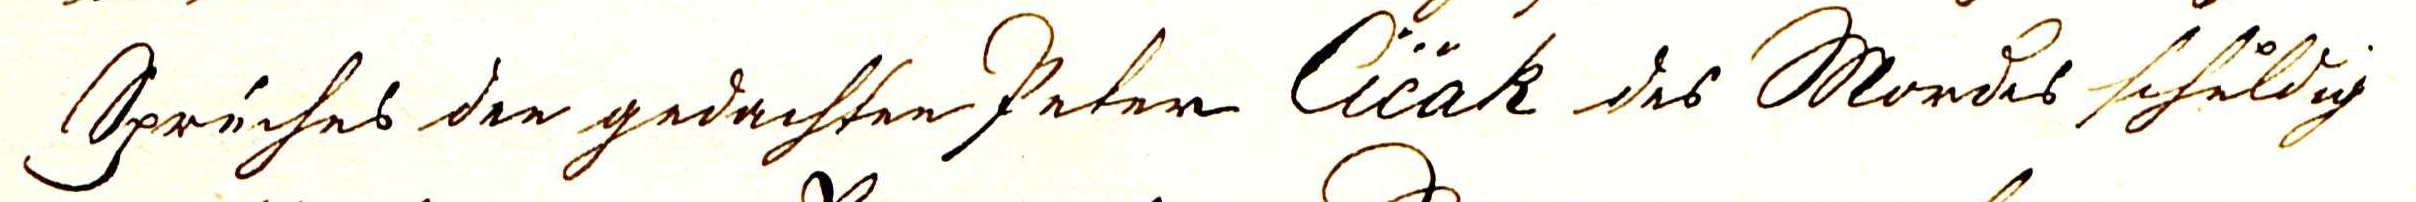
Spruches den gedachten Peter Čičak des Mordes schuldig
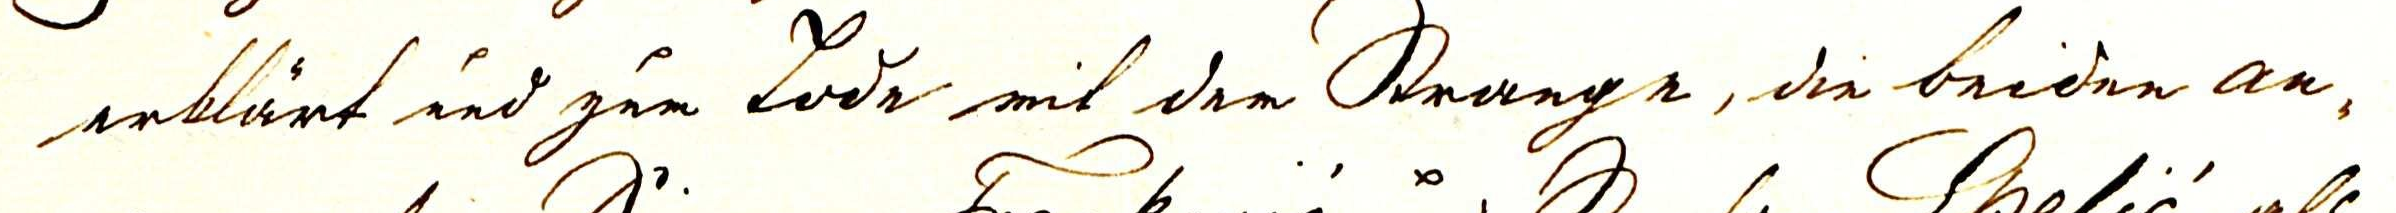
erklärt und zum Tode mit dem Strange, die beiden an¬
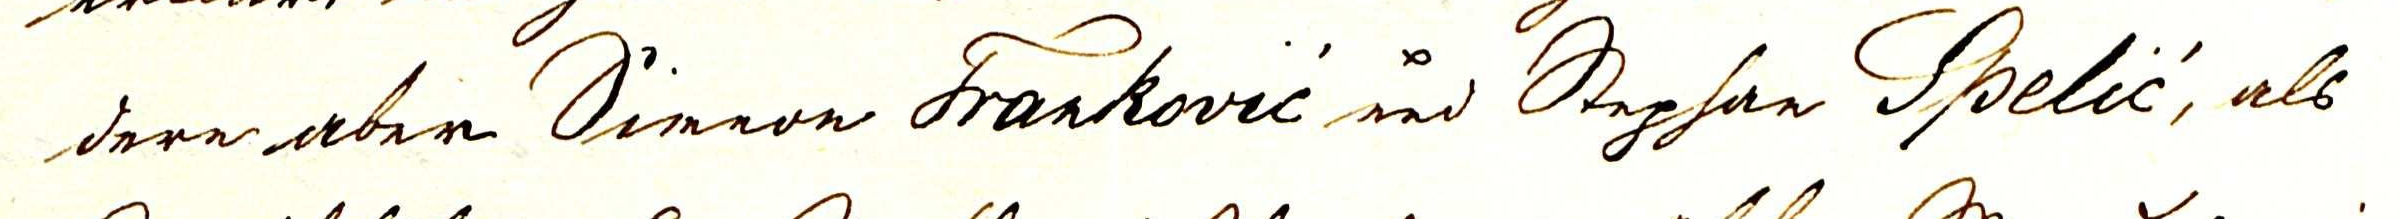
dere aber Simeon Franković und Stephan Spelić, als
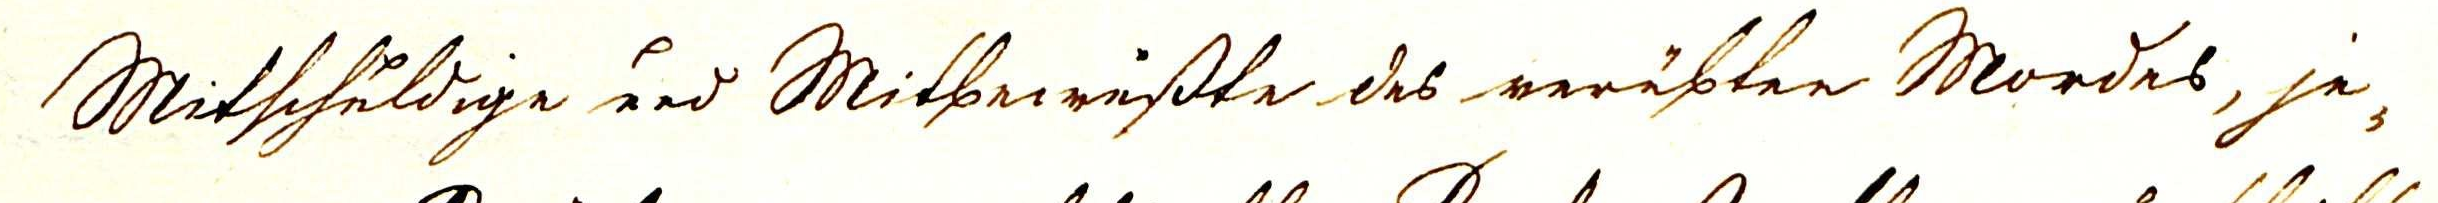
Mitschuldige und Mitbewußte des verübten Mordes, je¬
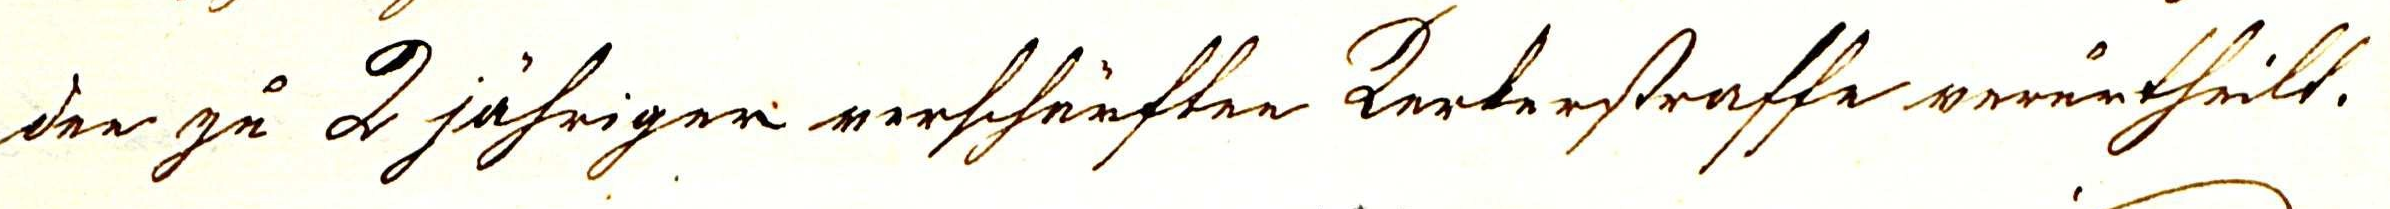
den zu 2jährigen verschärften Kerkerstrafe verurtheilt.
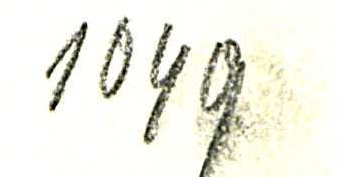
1049
